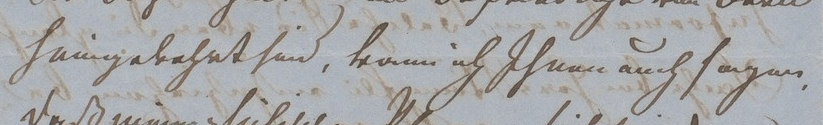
heimgekehrt sind, kann ich Ihnen auch sagen,
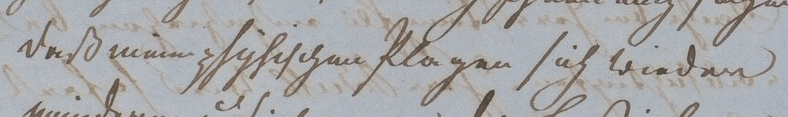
daß meine physischen Plagen sich wieder
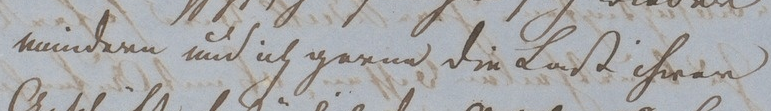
mindern und ich gerne die Last ihrer
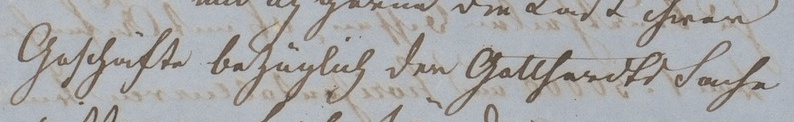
Geschäfte bezüglich der Gotthardt Sache
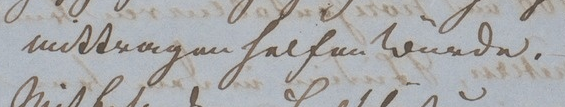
mittragen helfen würde. –
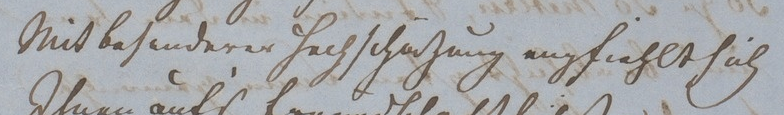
Mit besonderer Hochschätzung empfiehlt sich
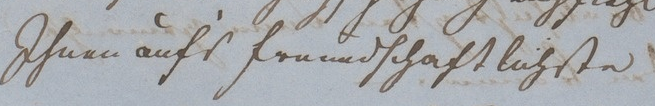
Ihnen auf's freundschaftlichste
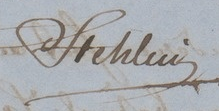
Stehlin
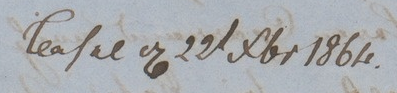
Basel den 22t Xbr 1864.
